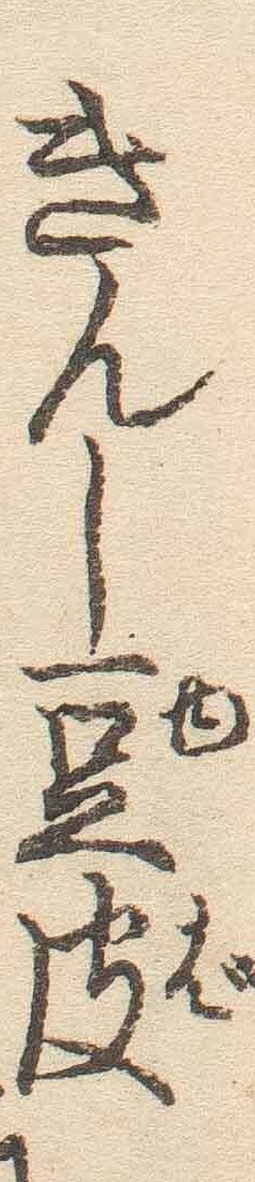きんし豆皮
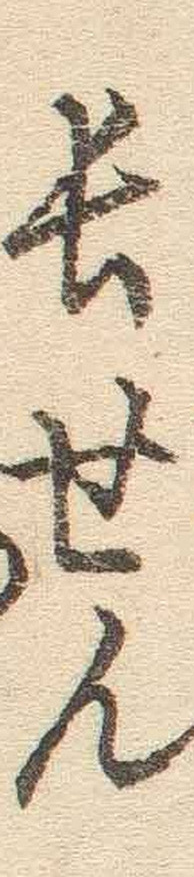長せん
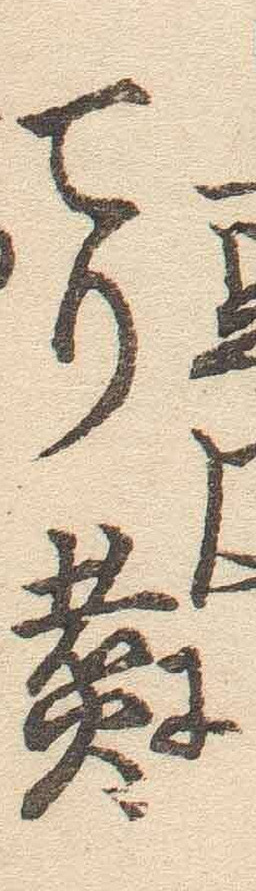てり煮
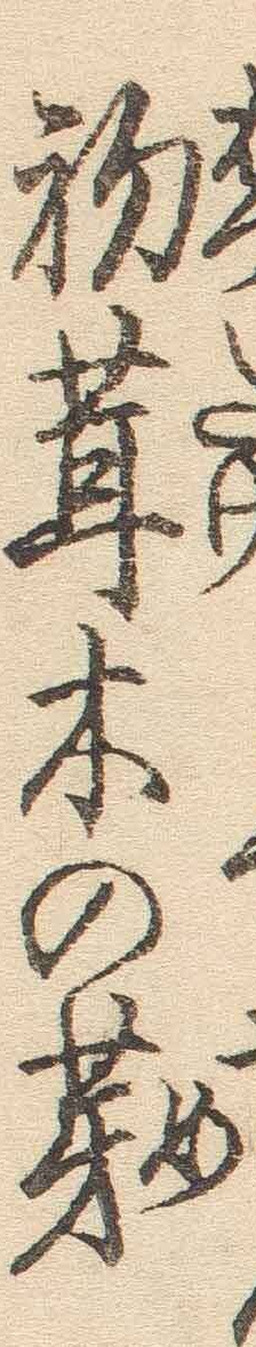初茸木の芽
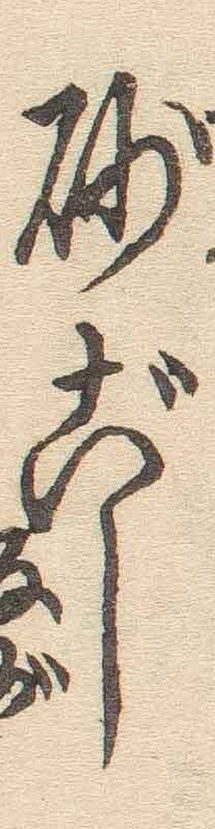砂ごし
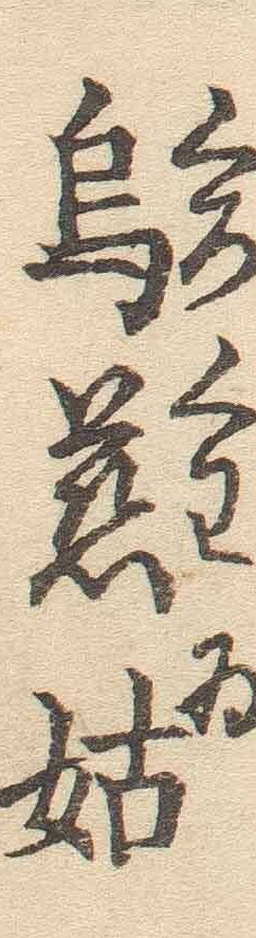烏慈姑
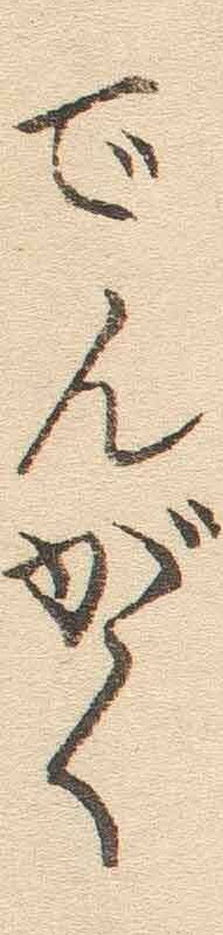でんがく
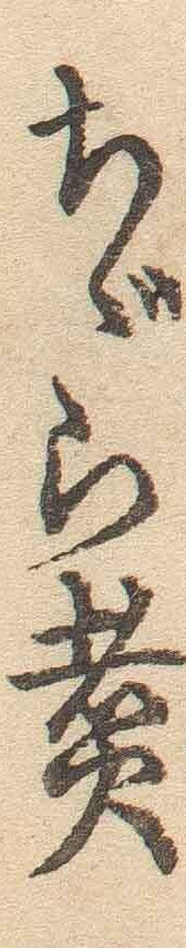ちヾら煮

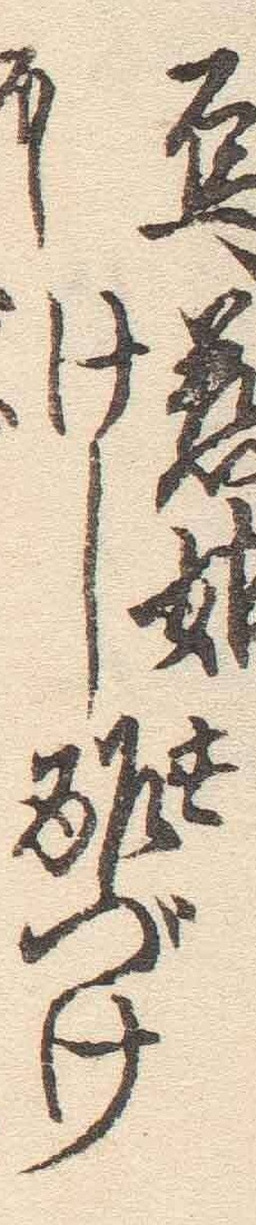けし酢あへ
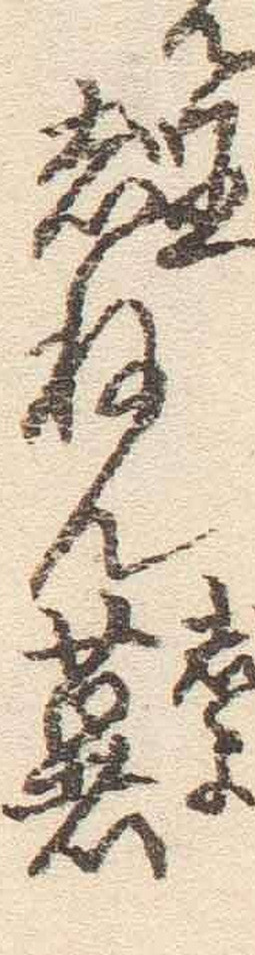じねん薯
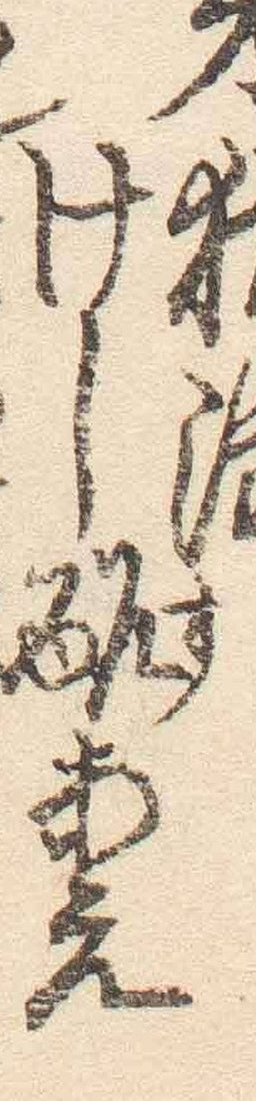けし酢あへ
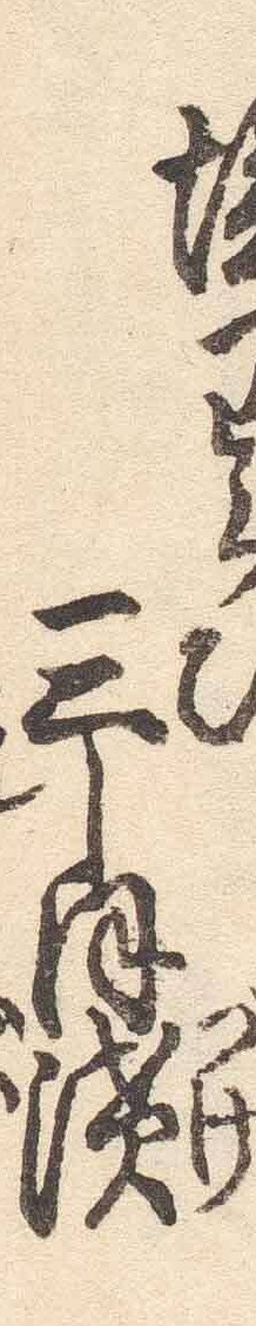三しほ漬
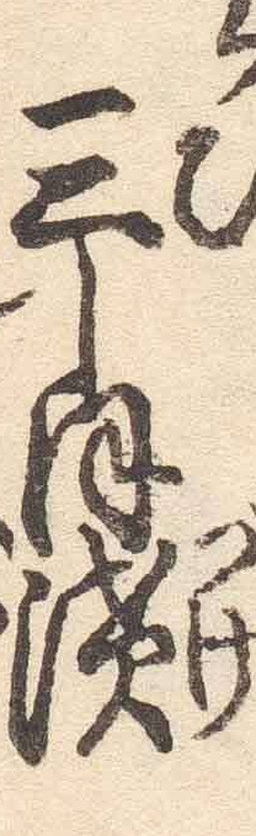三しほ漬
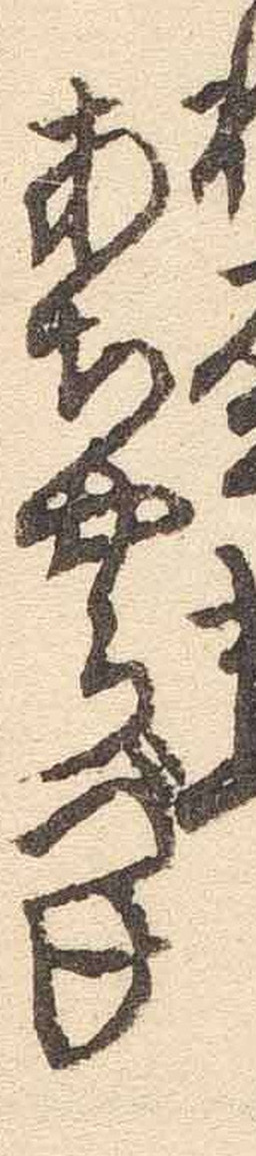あちやらづけ
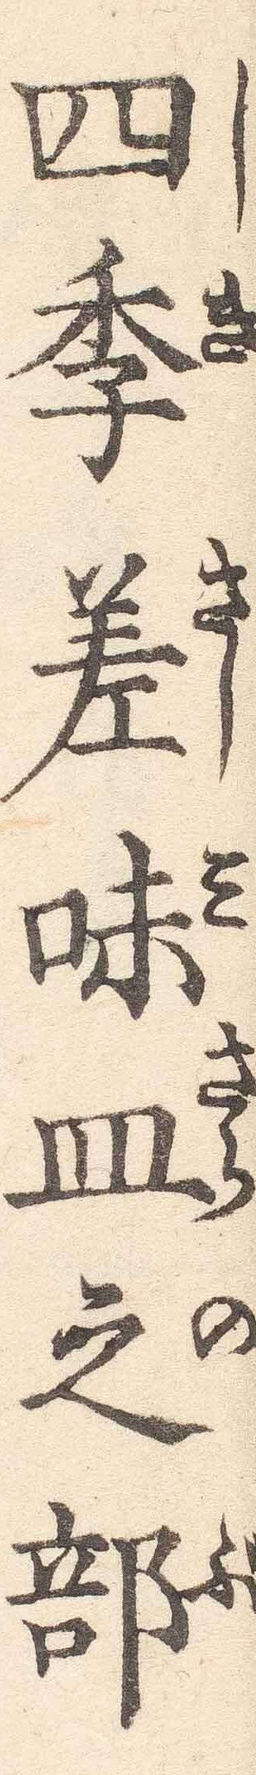四季差味皿之部
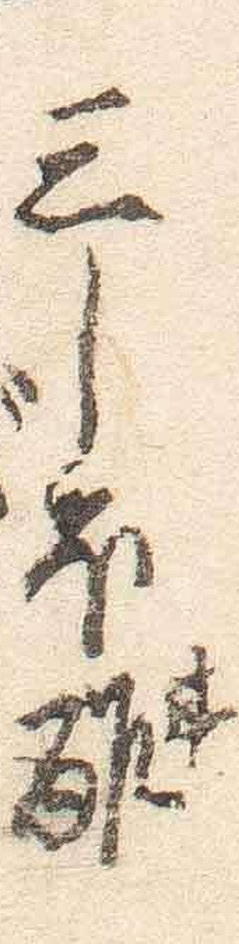三しほ漬
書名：料理通
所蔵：東京学芸大学附属図書館 国文学研究資料館
